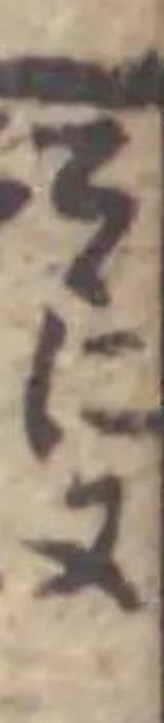こゝに又
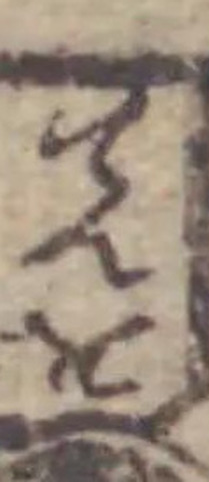てんを
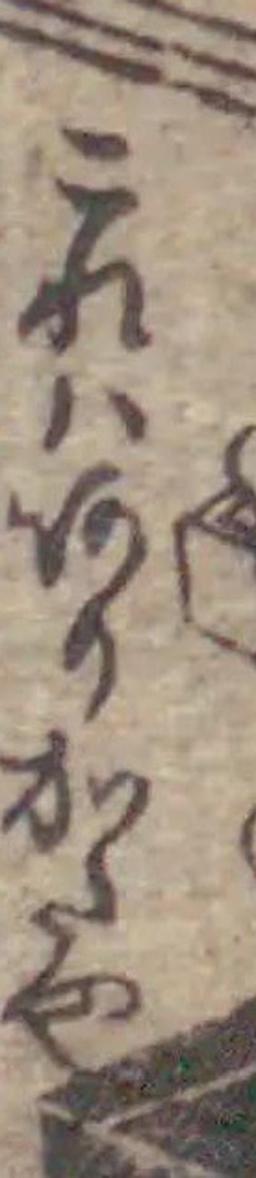これはありかたや
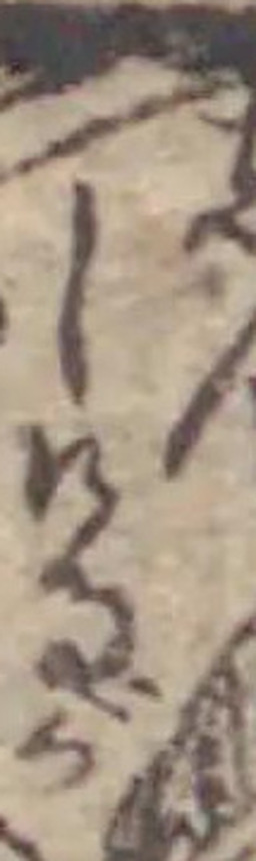しけるが
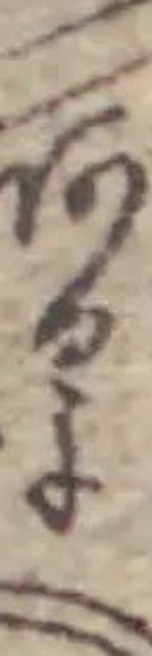あるよ
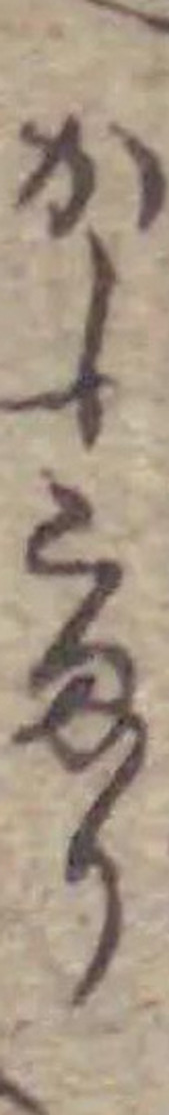かしこまり
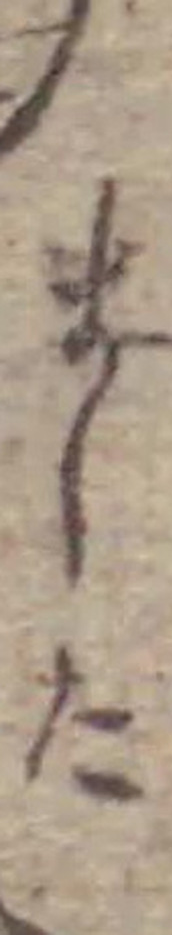ました
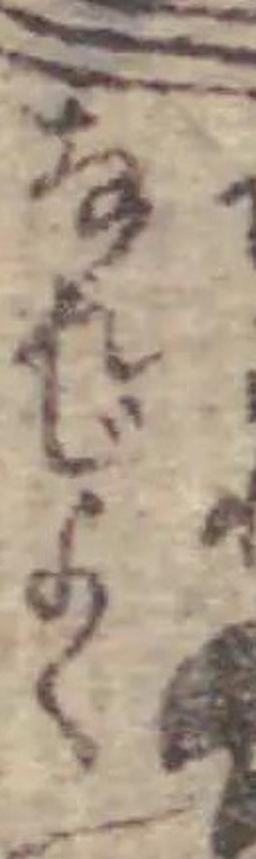なんじよく
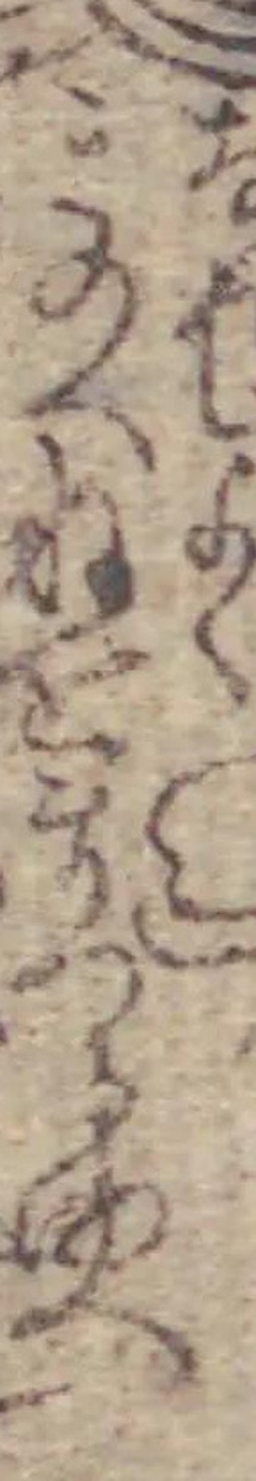このへねをまつるゆへ
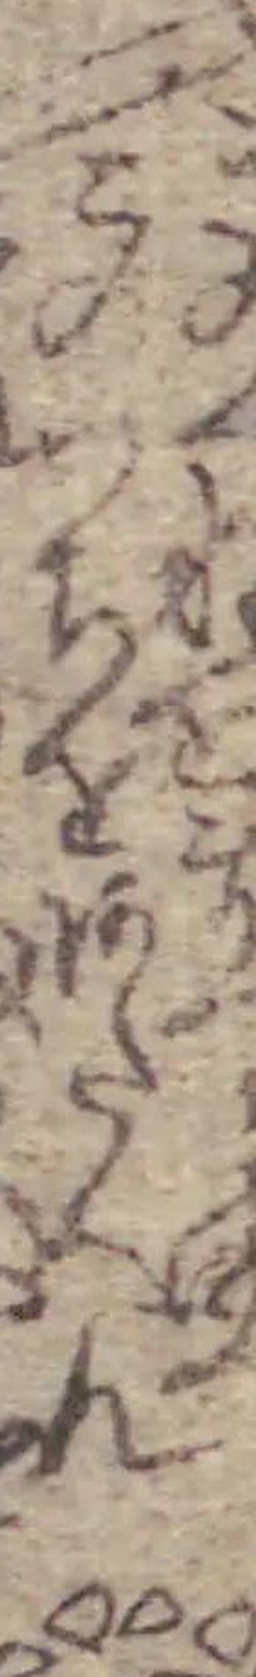このつちをあたへん
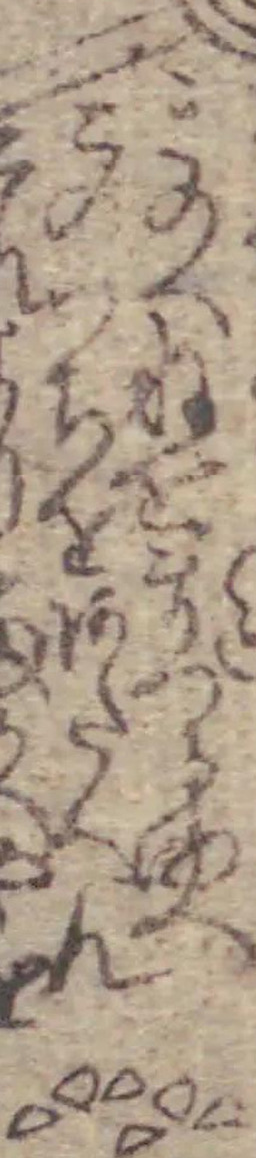このつちをあたへん
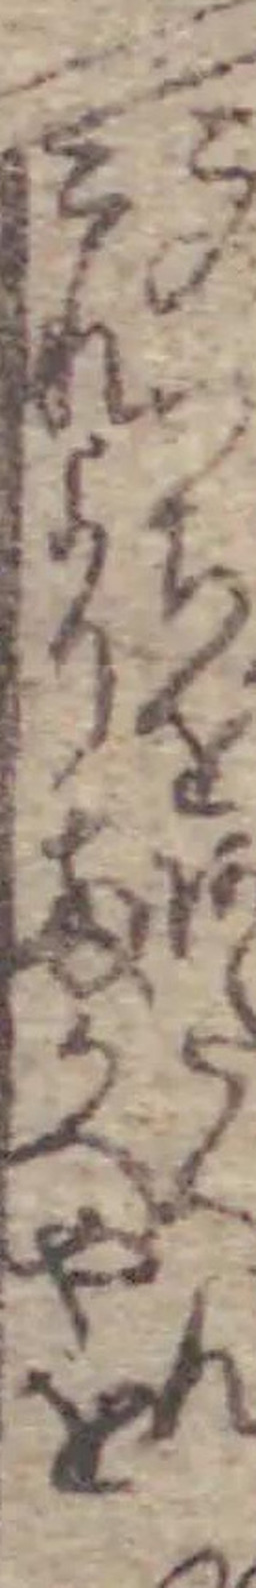これより両かへやを
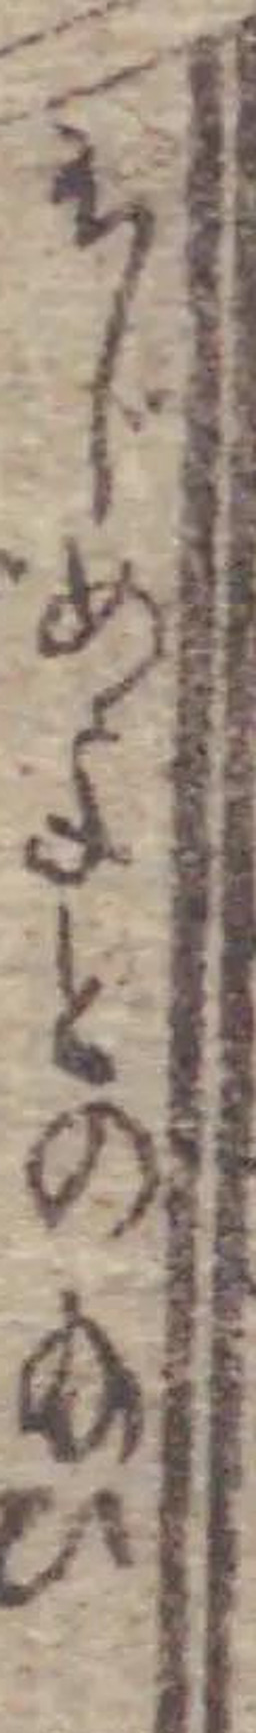はじめよとの給ひ
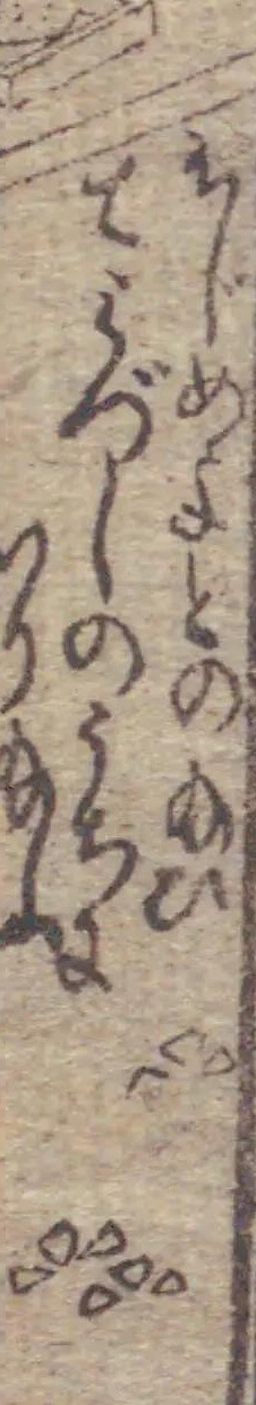てみづしのうちに
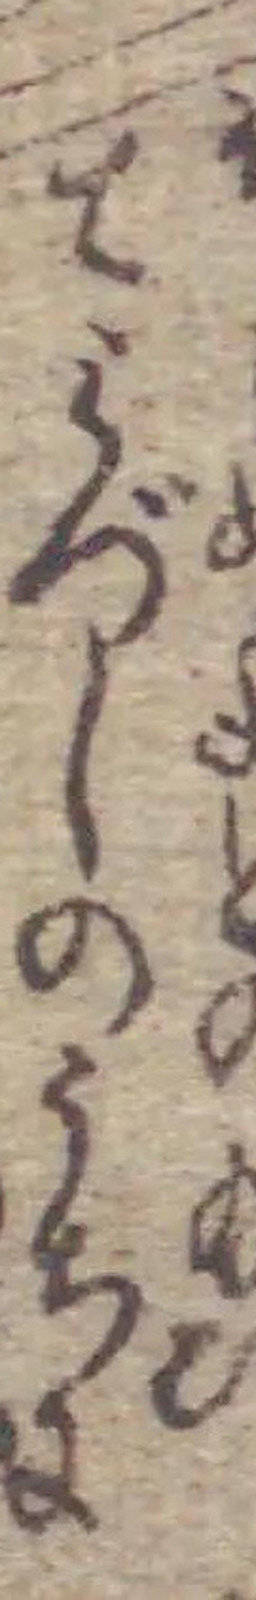てみづしのうちに
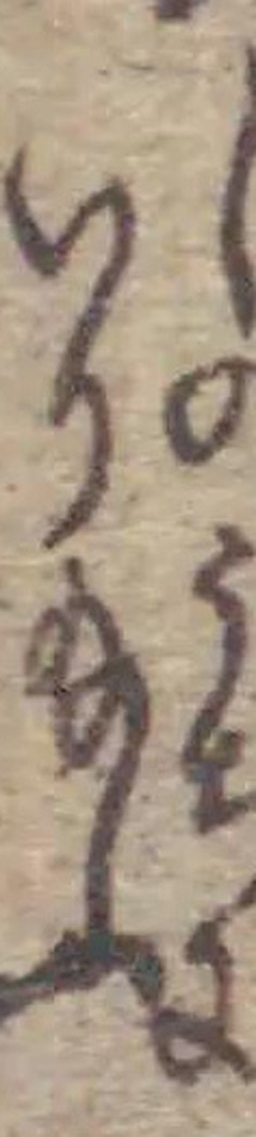いり給ふ
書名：日待御利生此ごろ噂 3巻
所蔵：国立国会図書館 National Diet Library, JAPAN
